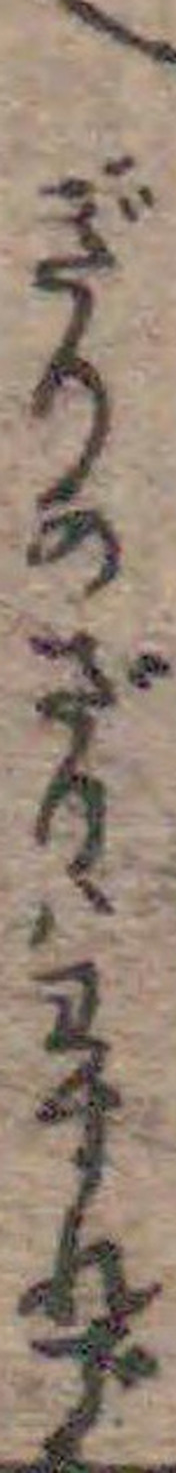ぎりのざりはわすれず
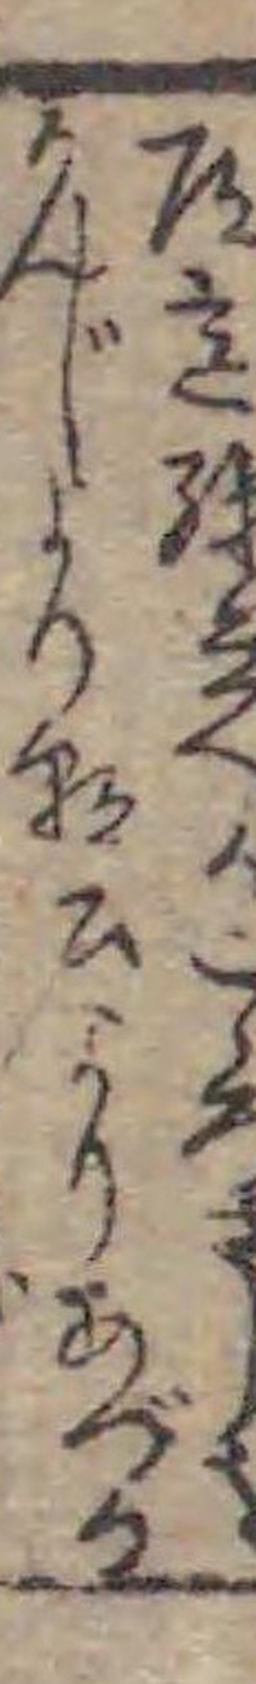かんじより朝公よりあづか
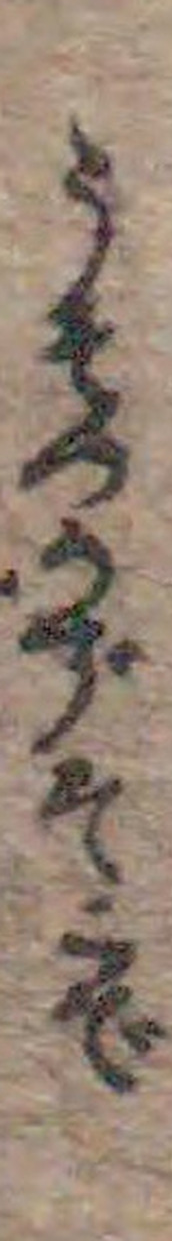うそつかずそこで
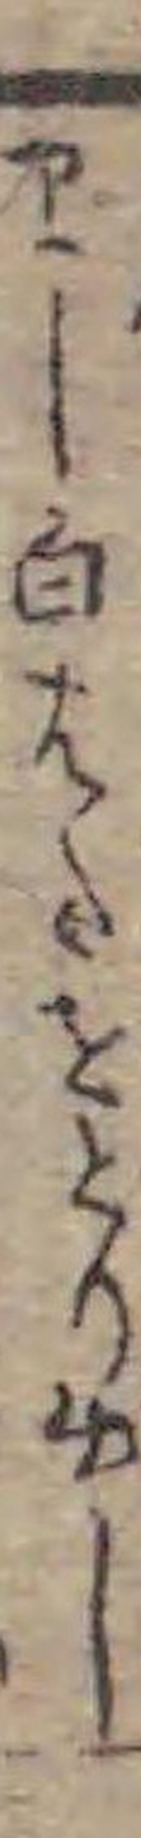りし白はたをとり出し
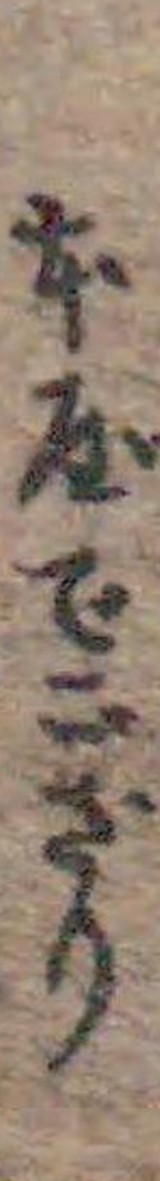本屋でござり
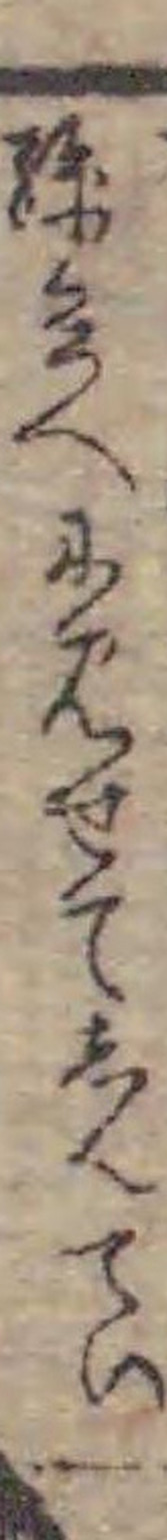孫兵へに見せてしんてい
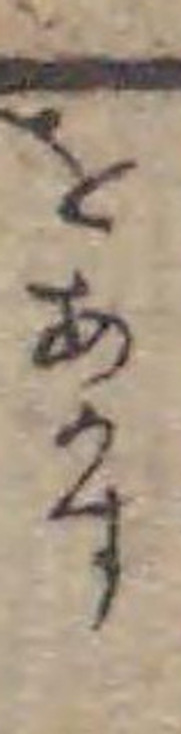をあかす
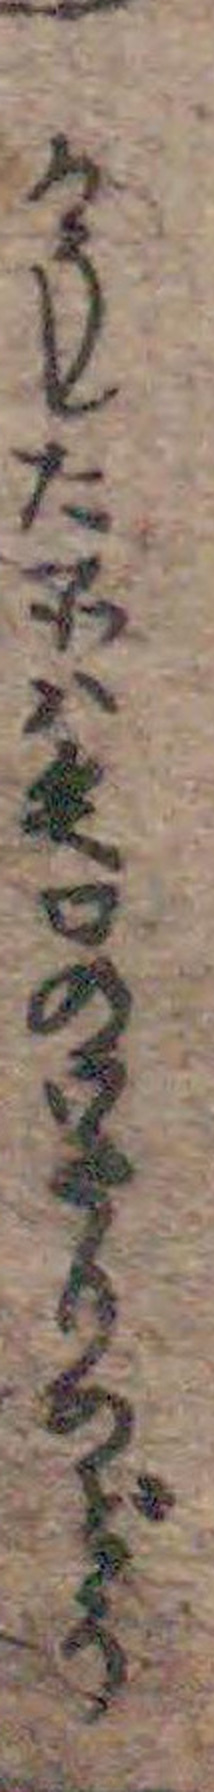かうした所は矢口のわたりのどう
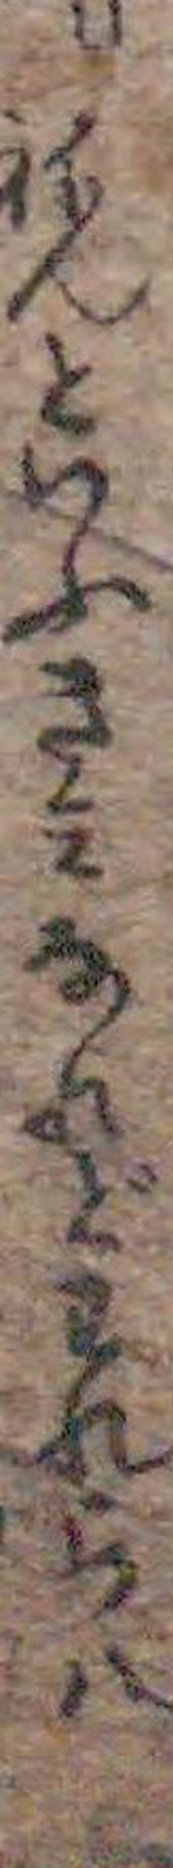ねんといふきみなれどわれらは
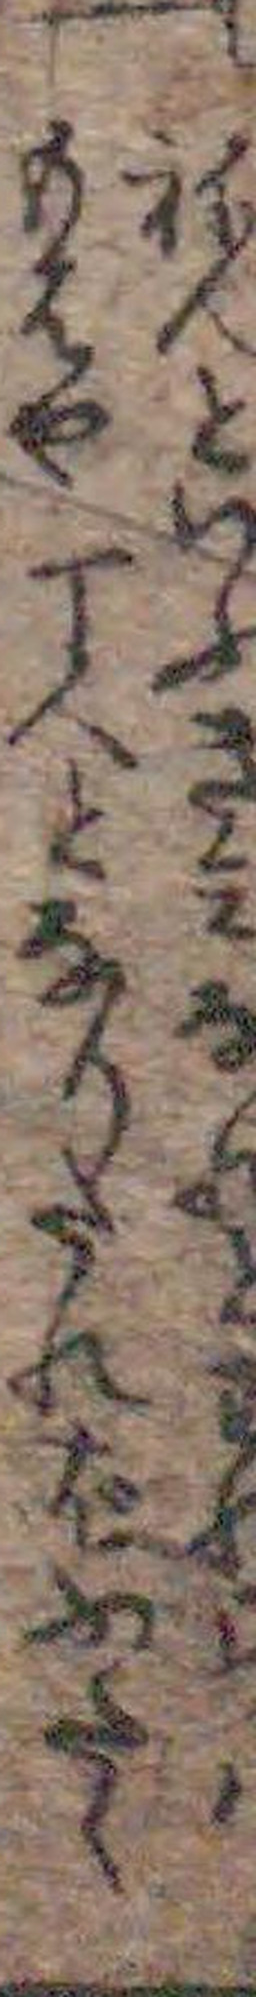もはや丁人となりたればふたゝ
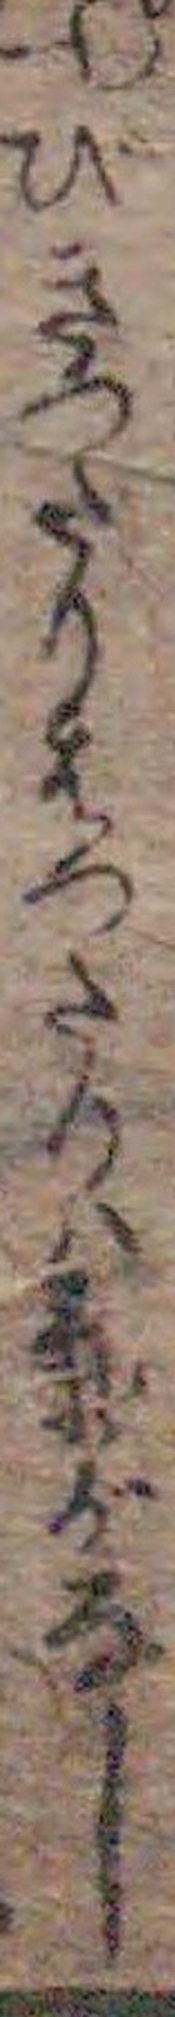びきつたりはつたりは気がなし
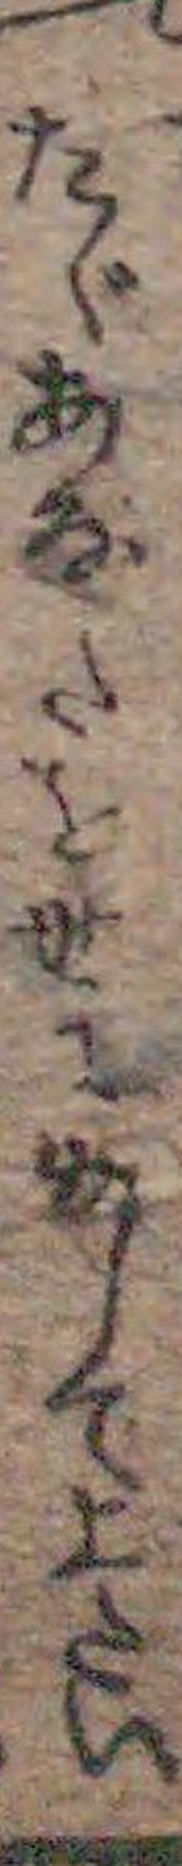たゞあなたをよに出して上たい
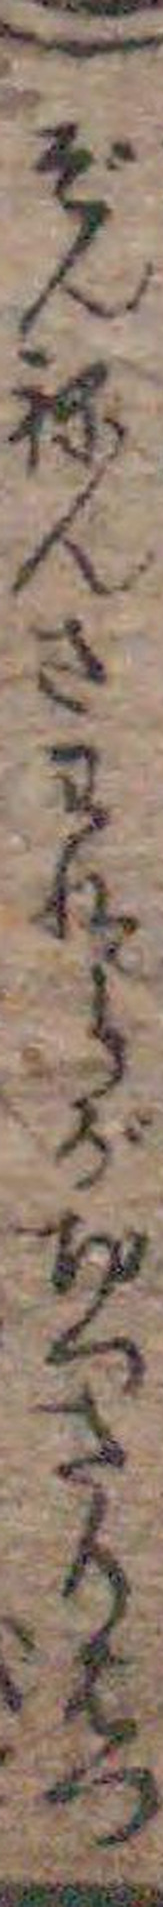ぞんねんさわれらが切つたりはつ
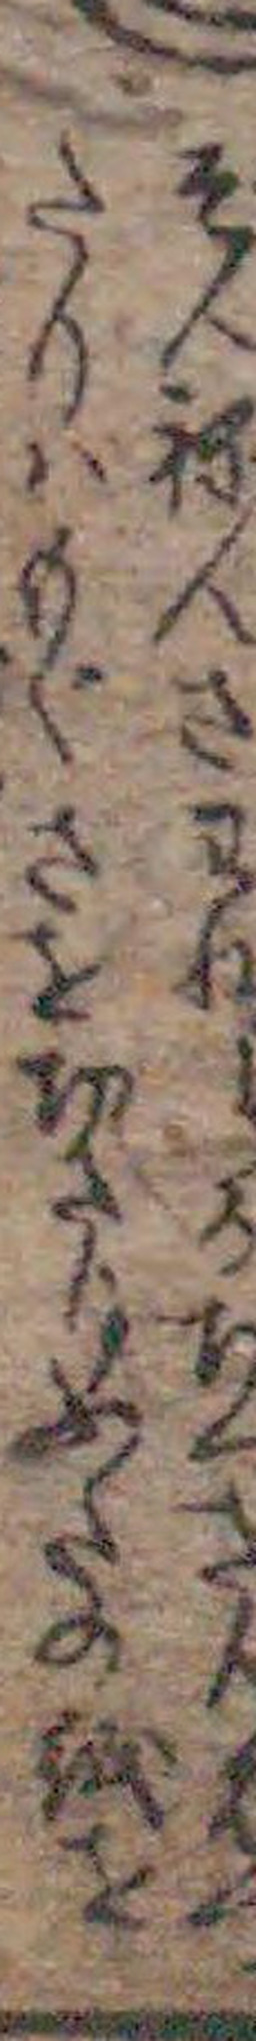たりはもぐさを切たりふたの紙を

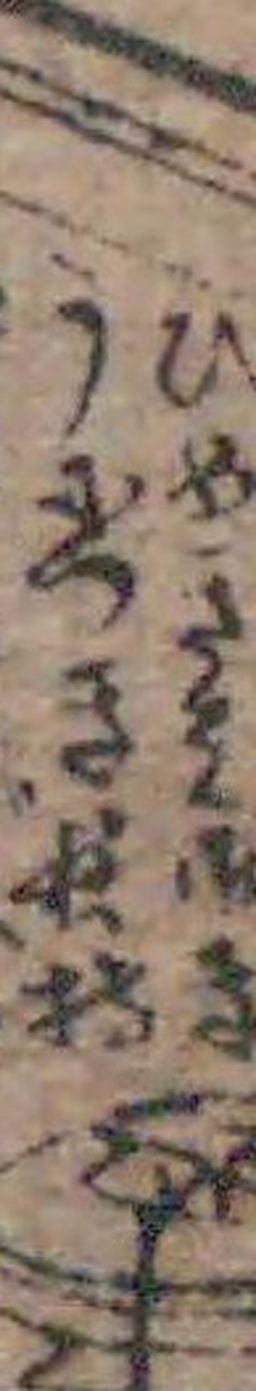うにつき長持
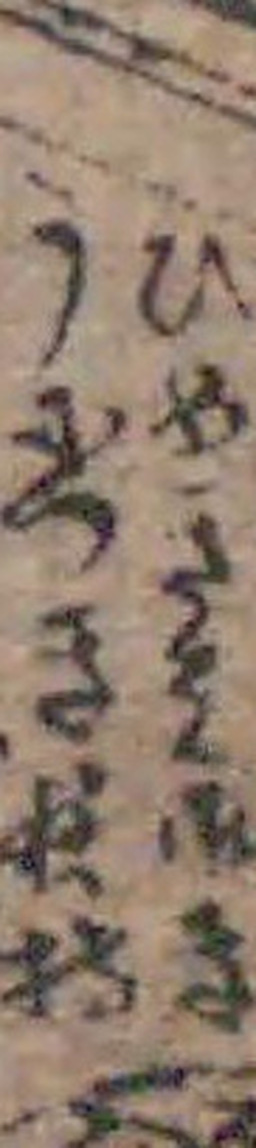うにつき長持
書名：三舛増鱗組 : 3巻
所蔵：国立国会図書館 National Diet Library, JAPAN
